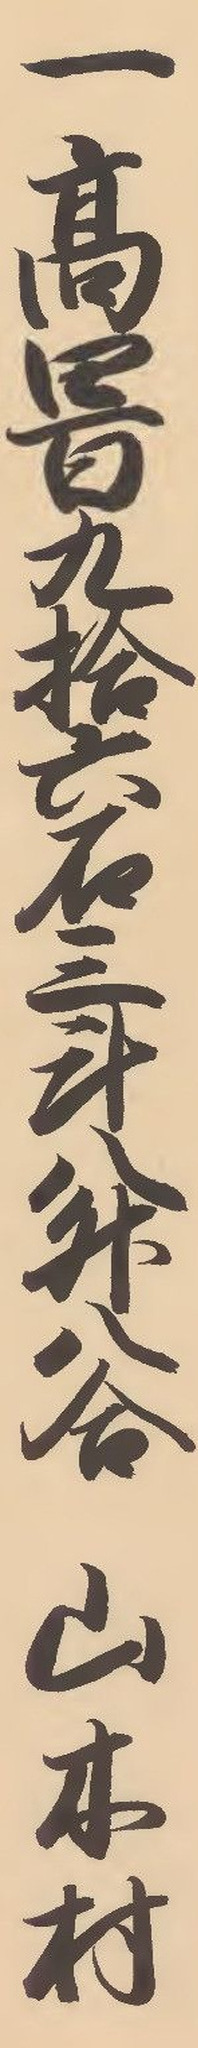一高四百九拾六石三斗八升八合山木村
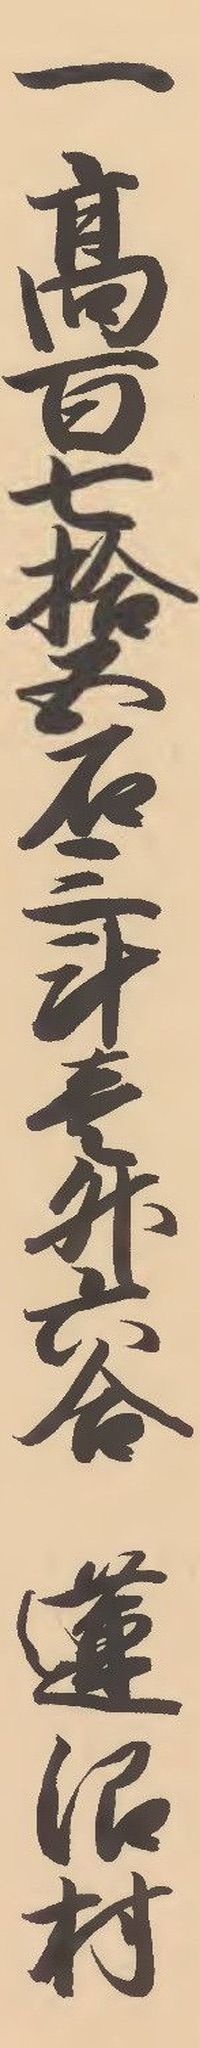一高百七拾五石三斗壱升六合蓮沼村
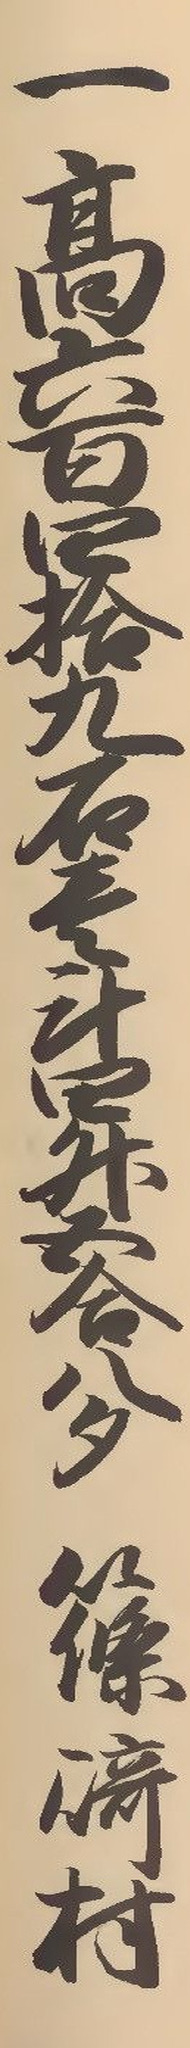一高六百四拾九石壱斗四升五合八勺篠崎村
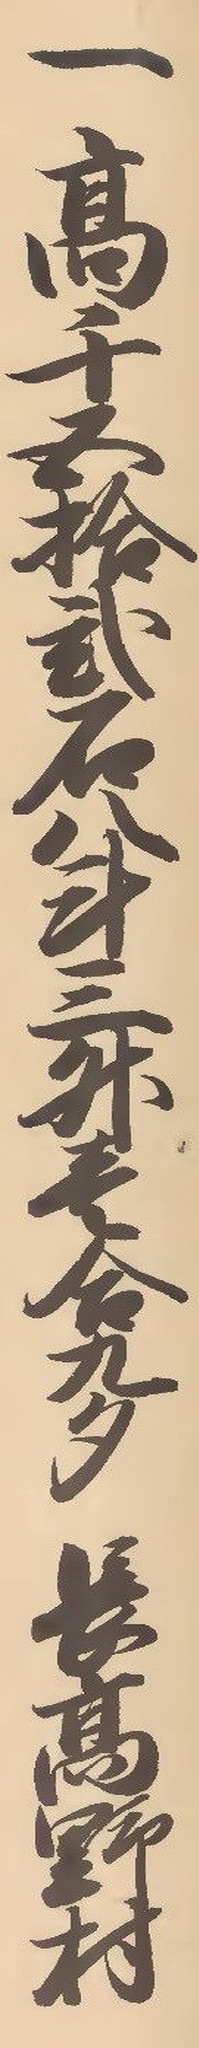一高千五拾弐石八斗三升壱合九勺長高野村
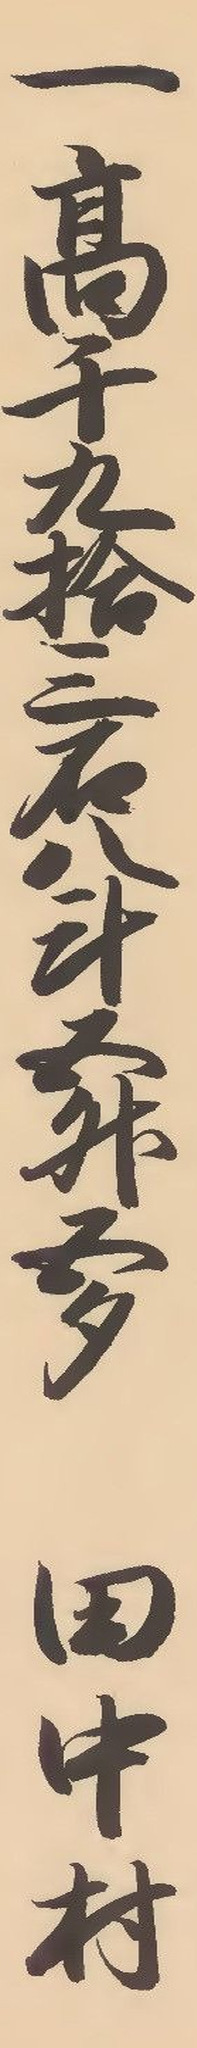一高千九拾三石八斗五升五勺田中村
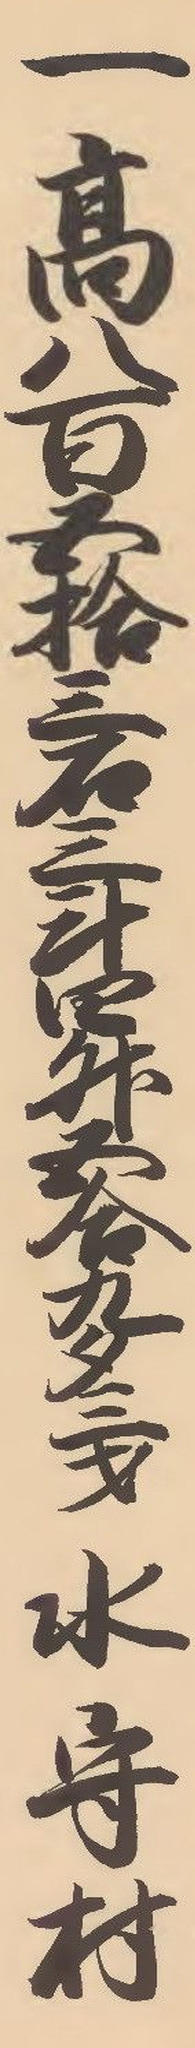一高八百五拾三石三斗四升五合九勺三才水守村
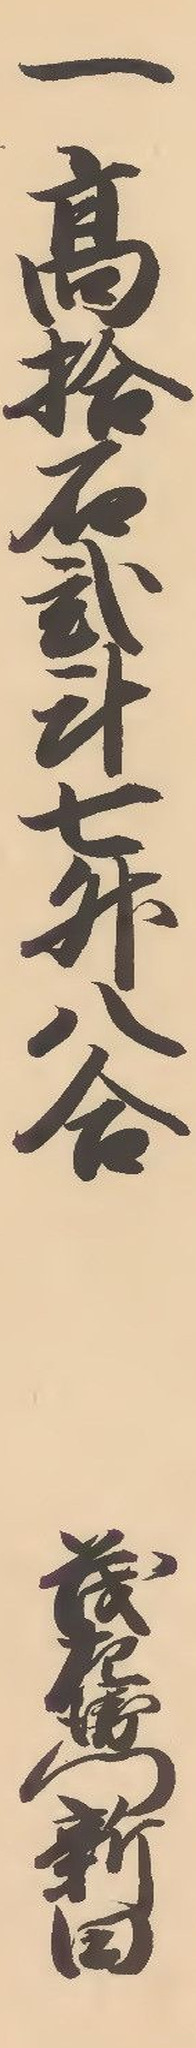一高拾石弐斗七升八合茂左衛門新田

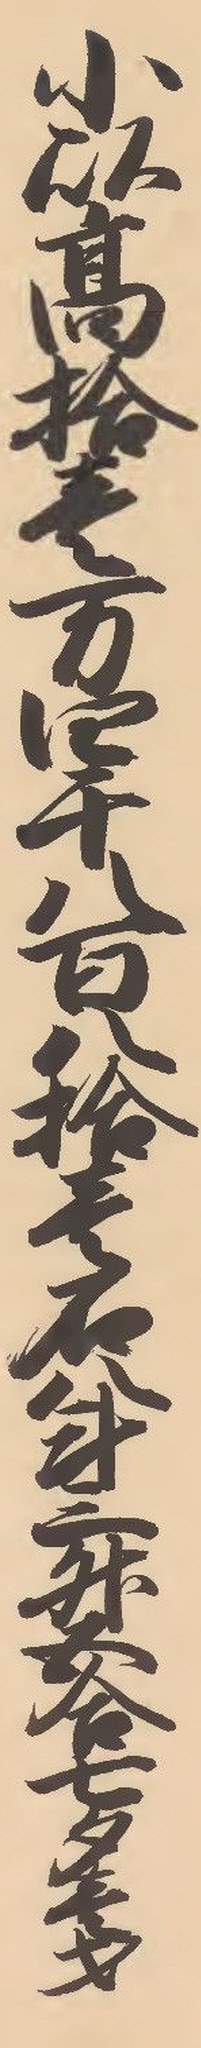小以高拾壱万四千八百八拾壱石八斗三升五合七勺壱才
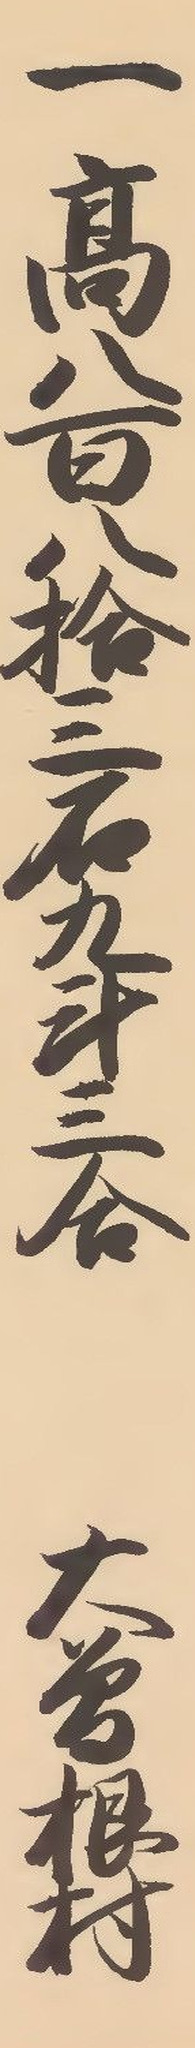一高八百八拾三石九斗三合大曽根村
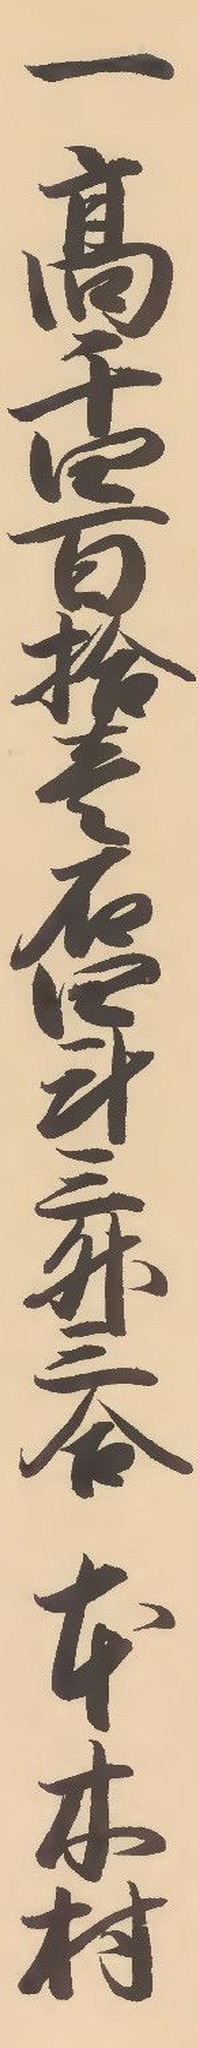一高千四百拾壱石四斗三升三合本木村
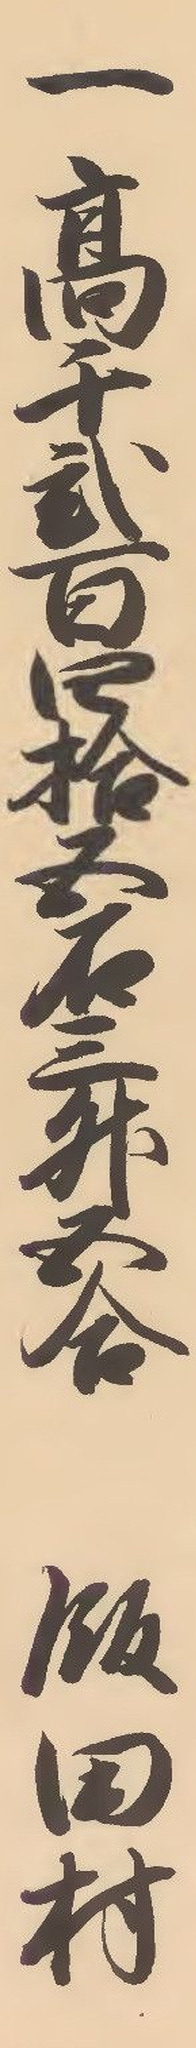一高千弐百四拾五石三升五合飯田村

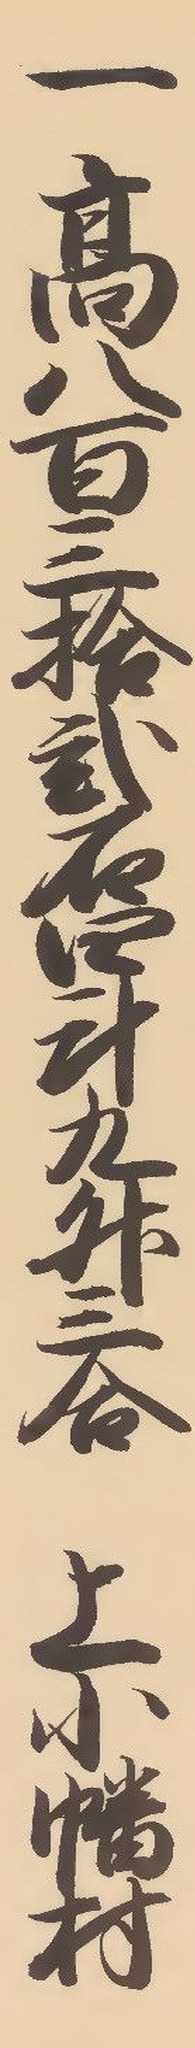一高八百三拾弐石四斗九升三合上小幡村
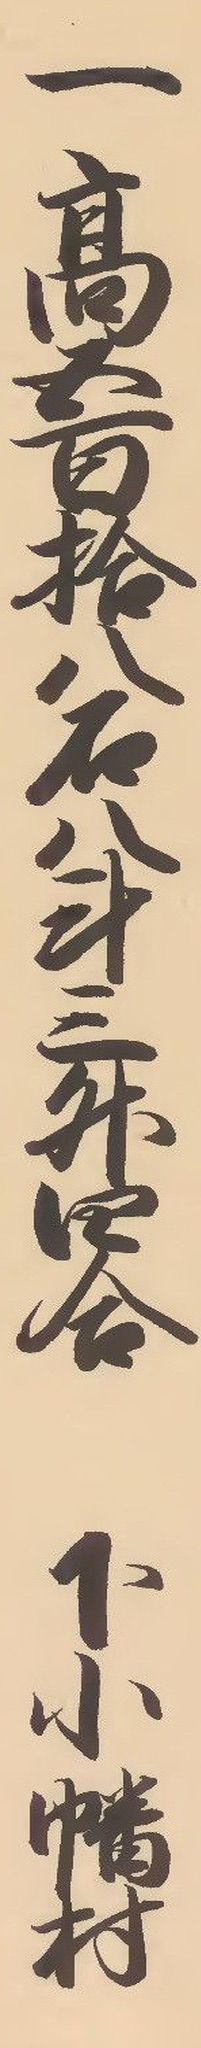一高五百拾八石八斗三升四合下小幡村
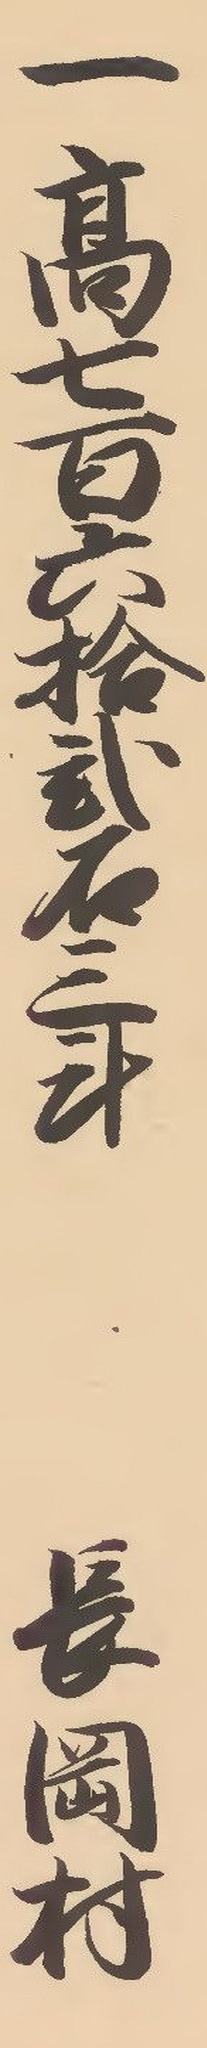一高七百六拾弐石三斗長岡村
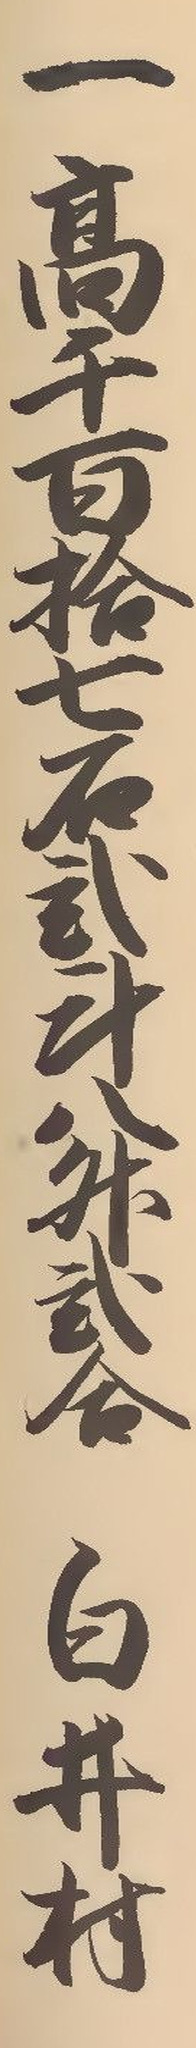一高千百拾七石弐斗八升弐合白井村
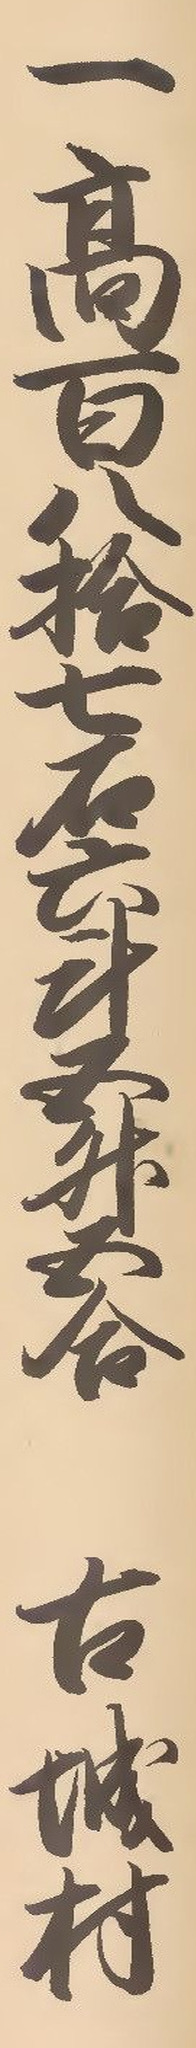一高百八拾七石六斗五升五合古城村
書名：常陸国郷帳
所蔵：国立公文書館 National Archives of Japan
